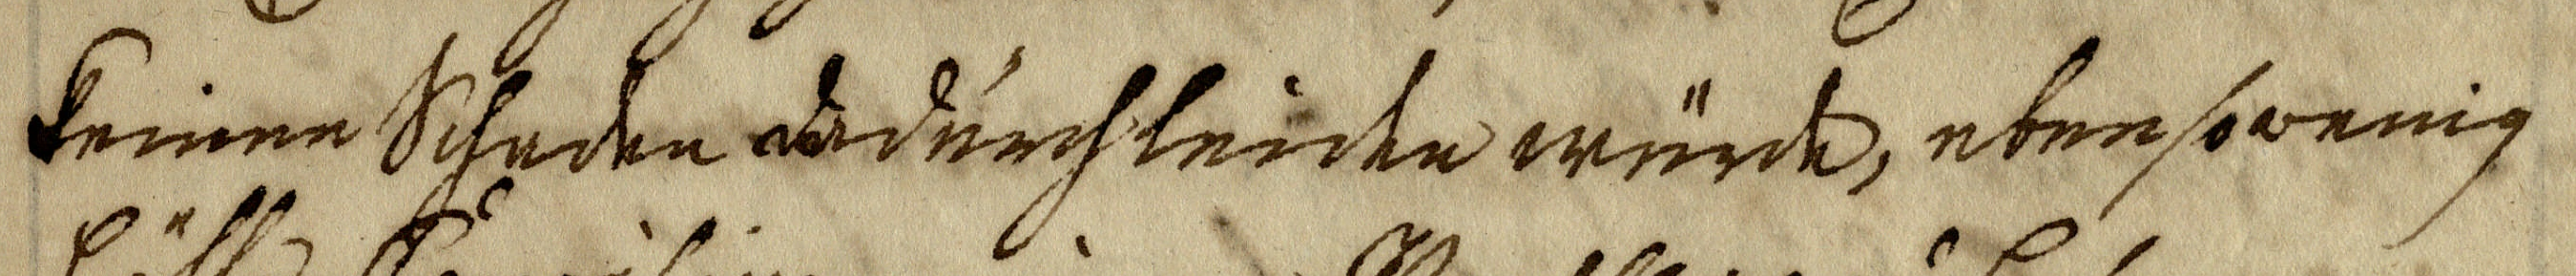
keinen Schaden dadurch leiden würde, eben sowenig
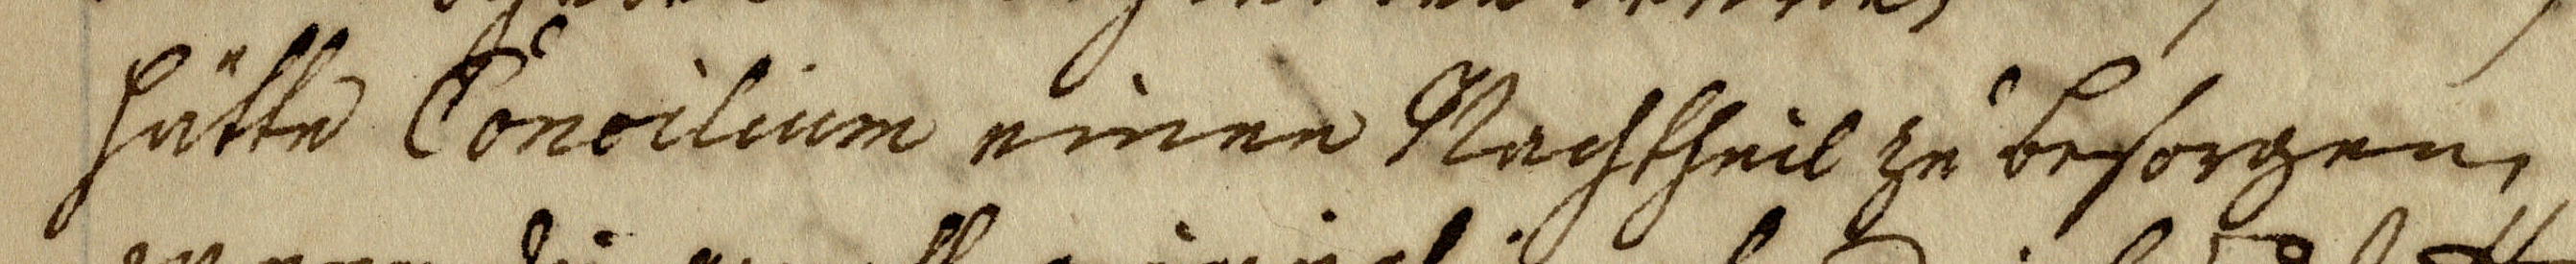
hätte Concilium einen Nachtheil zu besorgen,
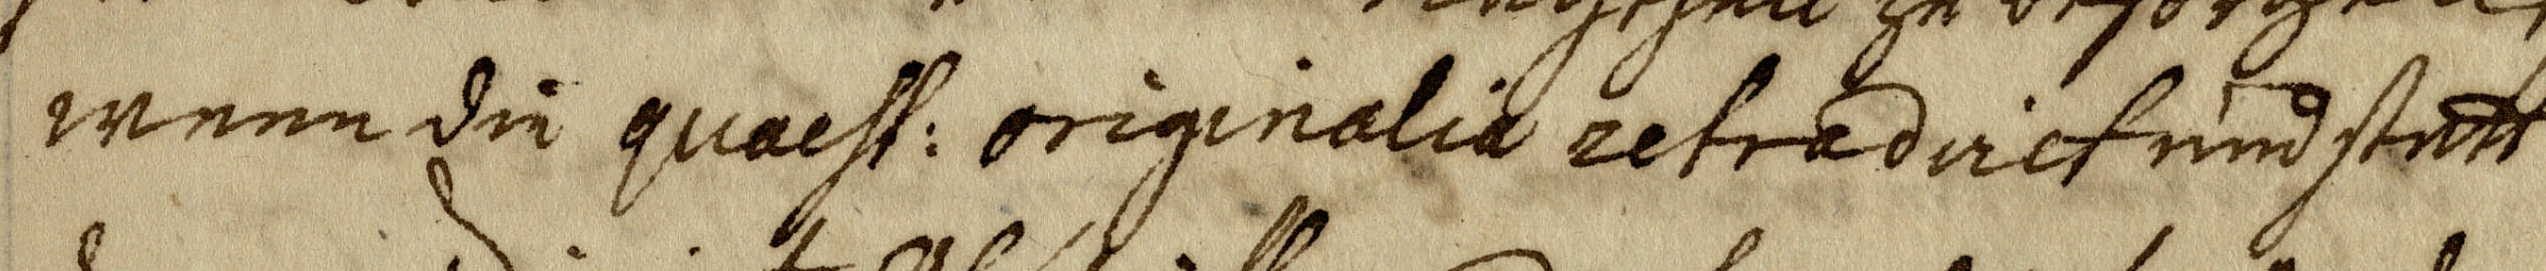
wenn die quaest. originalia retradiret und statt
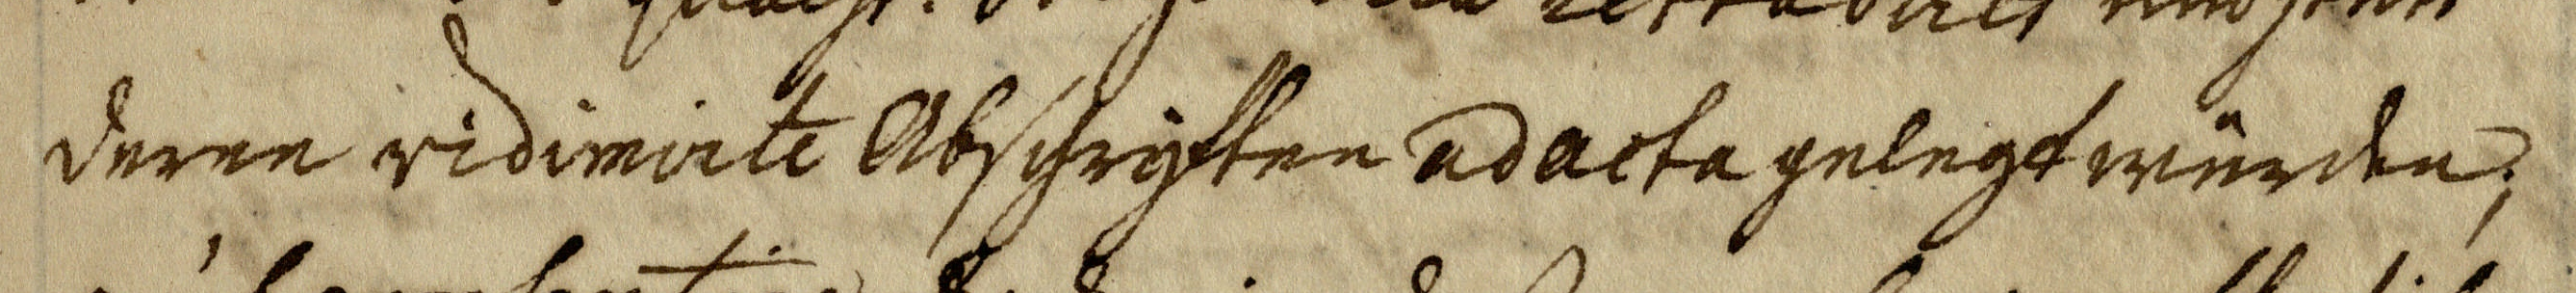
deren vidimirte Abschriften ad acta gelegt würden,
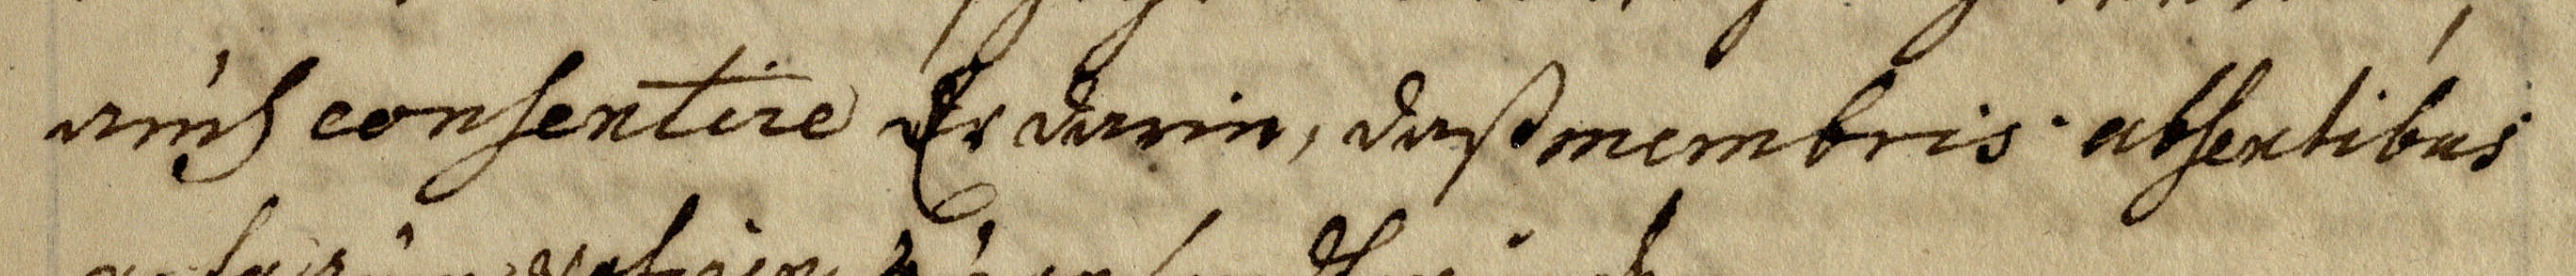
auch consentire Er darin, daß membris absentibus
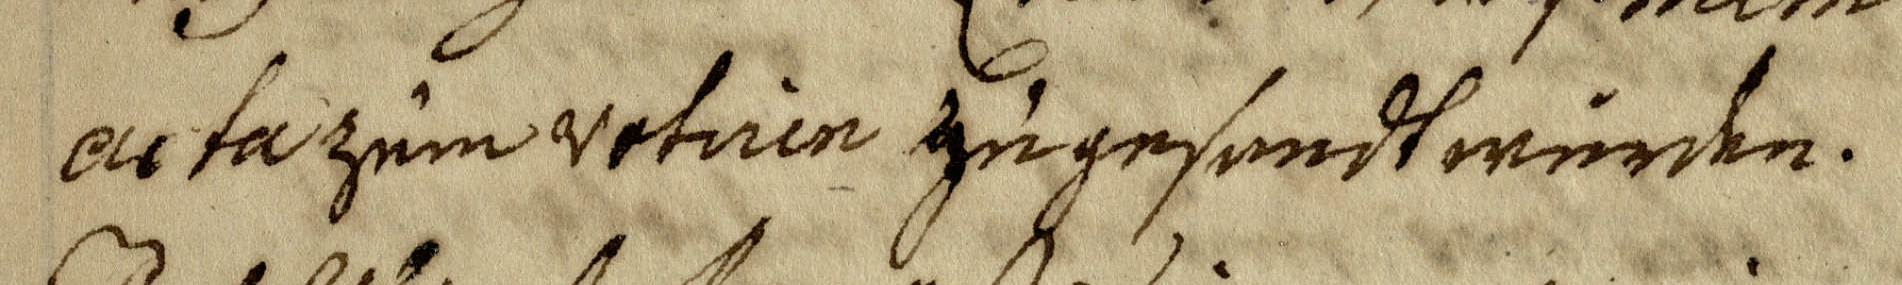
acta zum votiren zugesandt würden.
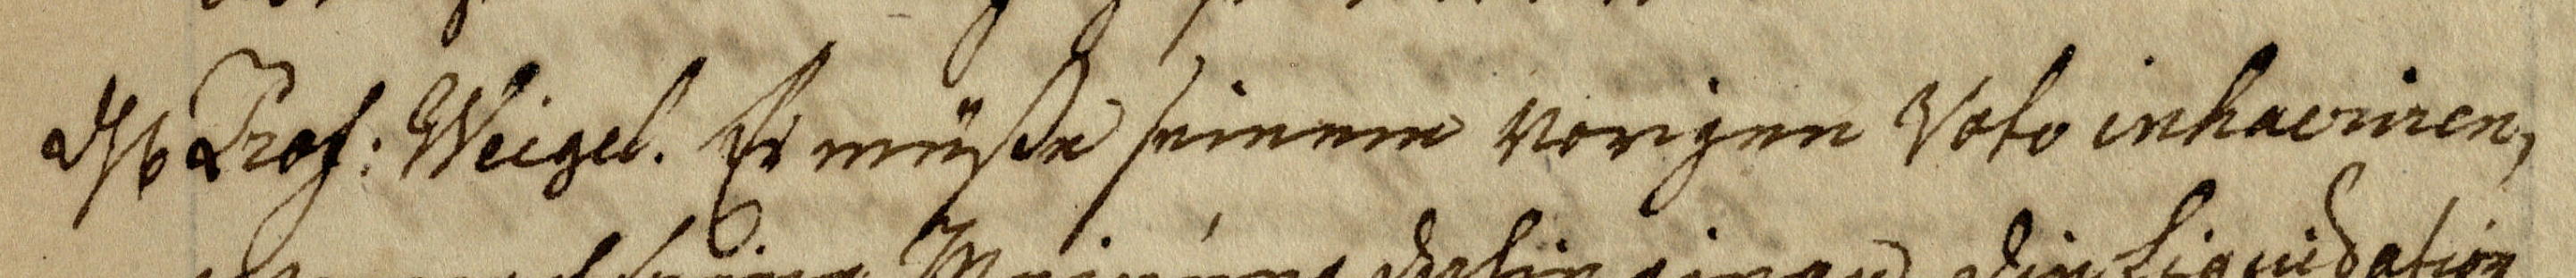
dh Prof. Weigel. Er müße seinem vorigen Voto inhaeriren,
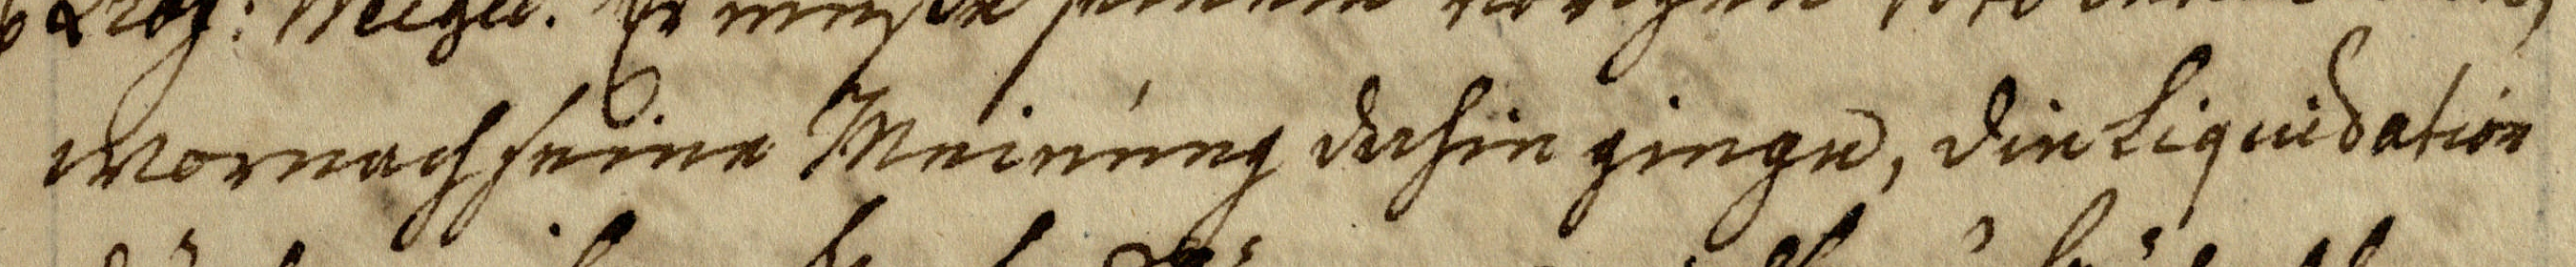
wornach seine Meinung dahin ginge, die Liquidation
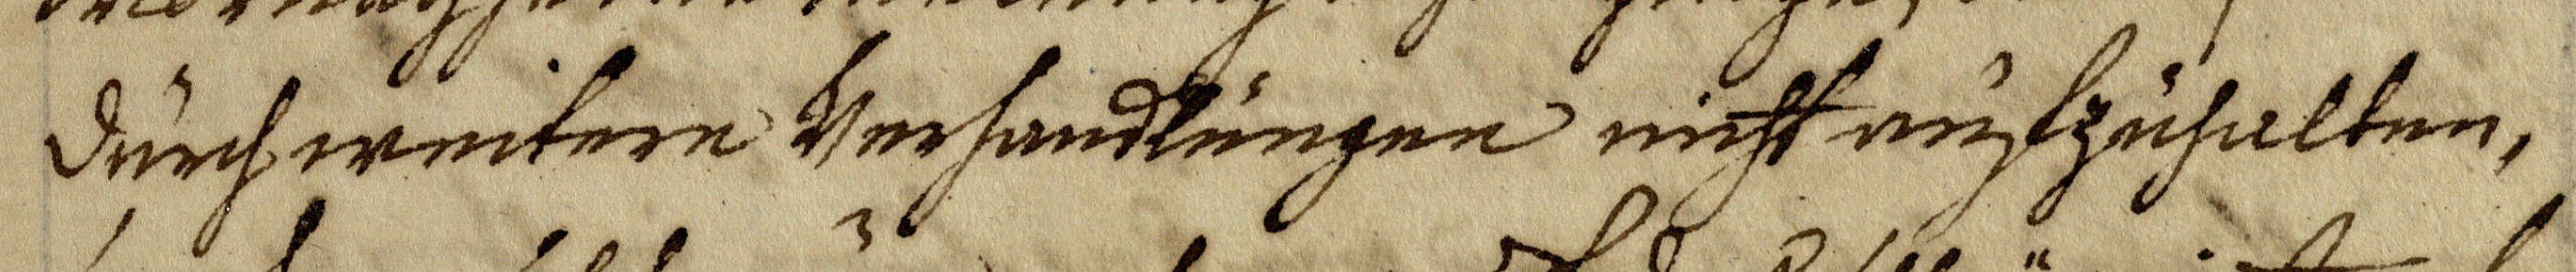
durch weitere Verhandlungen nicht aufzuhalten,
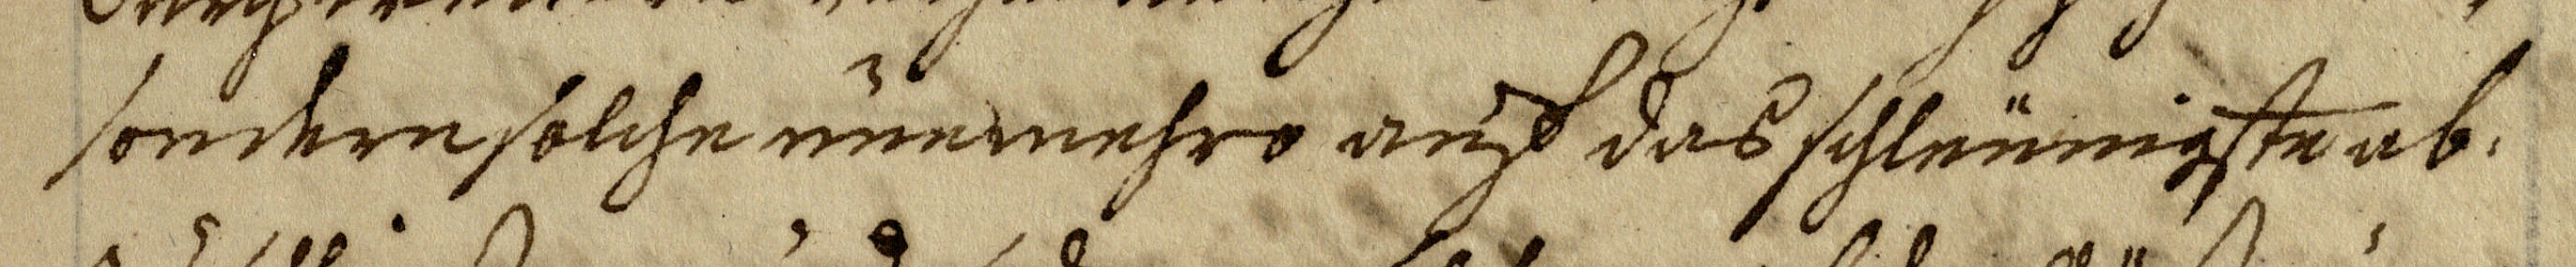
sondern solche nunmehro auf das schleunigste ab¬
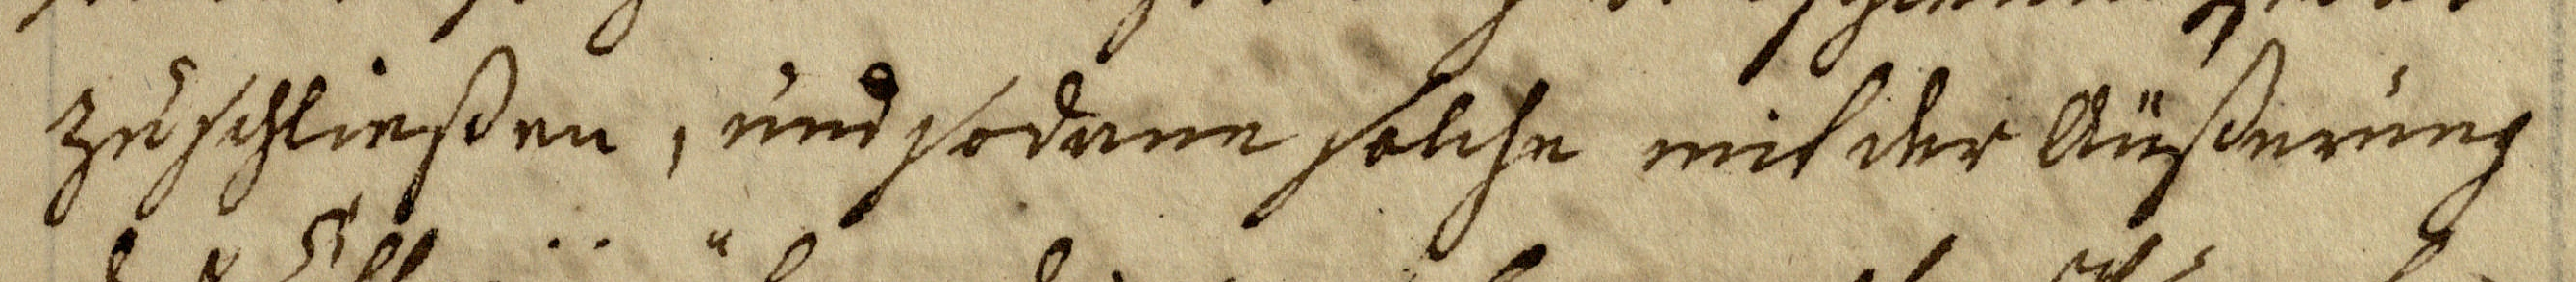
zuschließen, und sodann solche mit der Äußerung
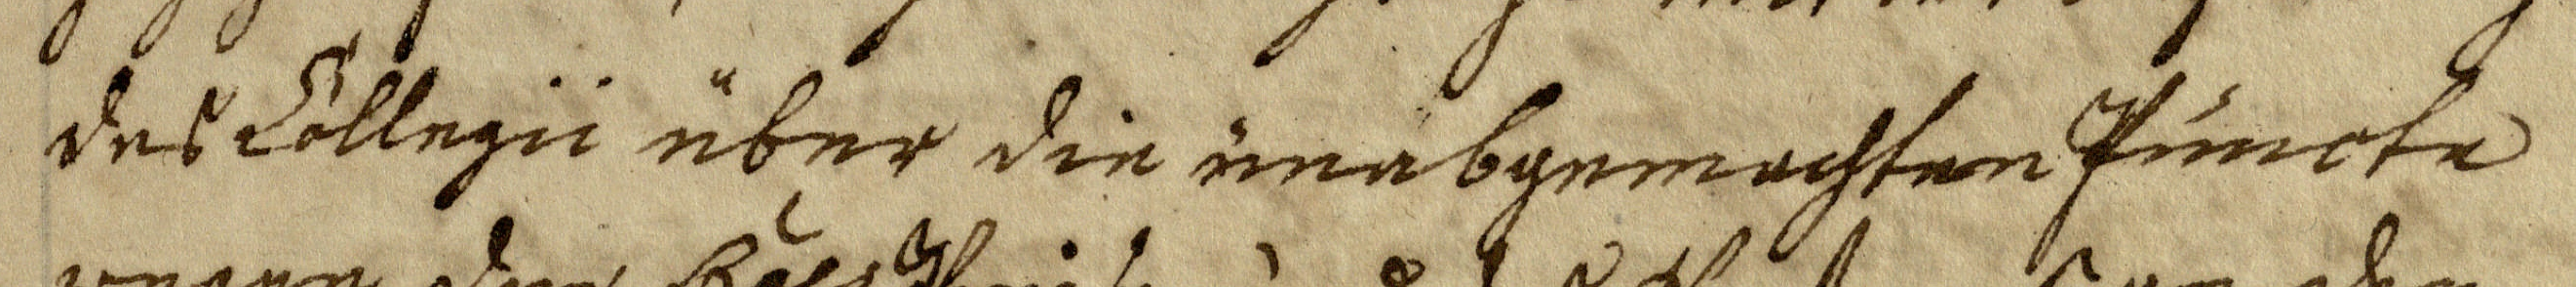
des Collegii über die unabgemachten Puncte
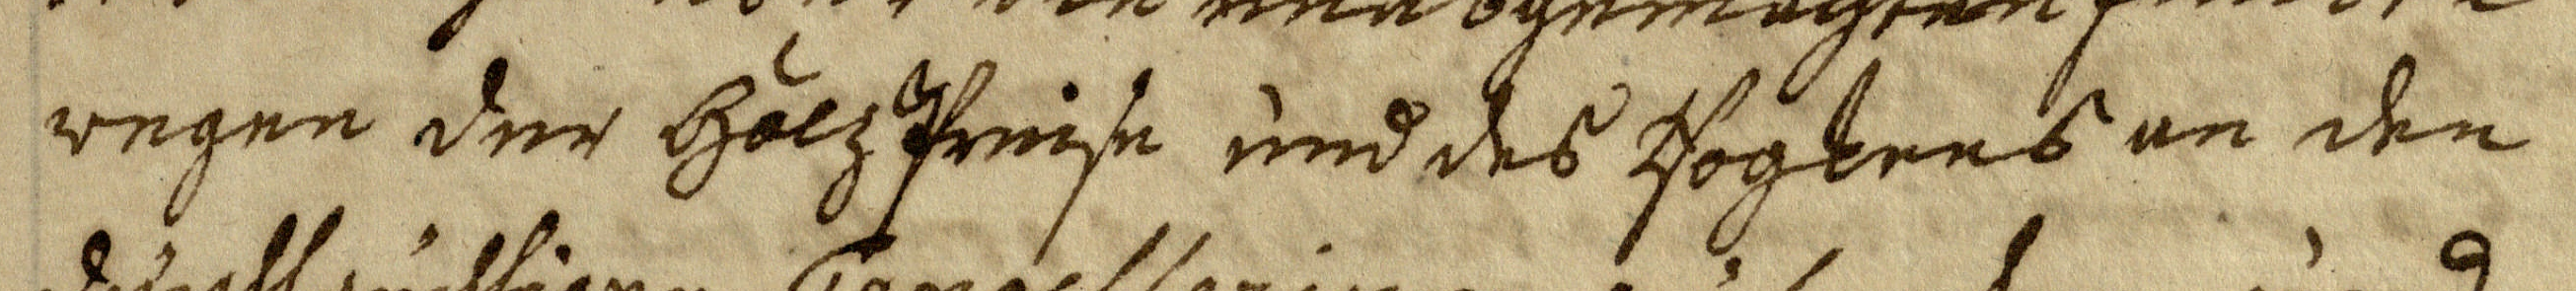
wegen der HolzPreise und des Rogkens an den
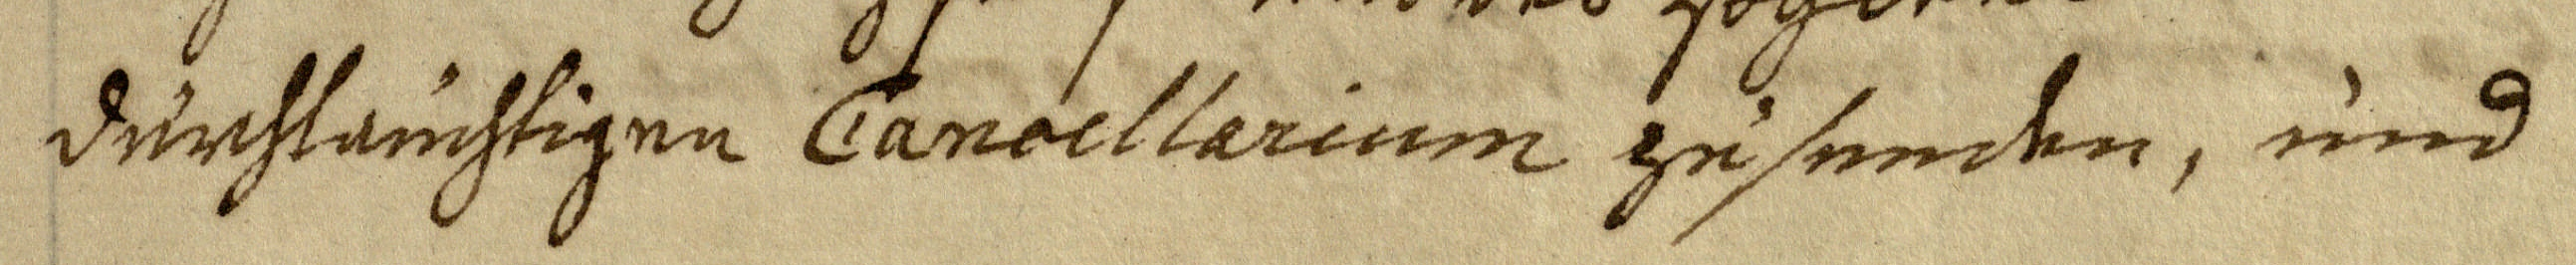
durchlauchtigen Cancellarium zusenden, und
